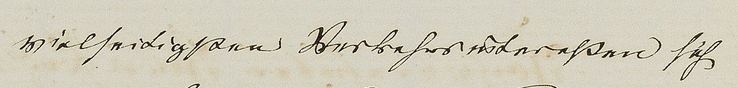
vielseitigsten Verkehrsintereßen sich
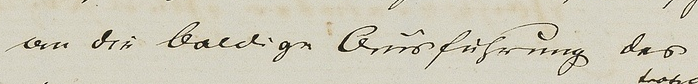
an die baldige Ausführung des
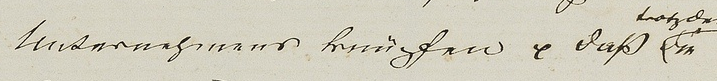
Unternehmens knüpfen & daß trotzdem
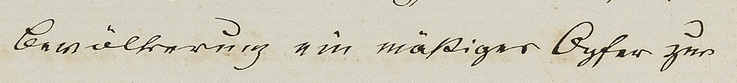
Bevölkerung ein mäßiges Opfer zur
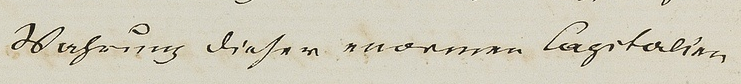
Wahrung dieser enormen Capitalien
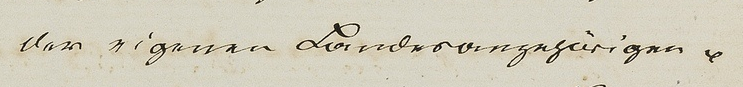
der eigenen Landesangehörigen &
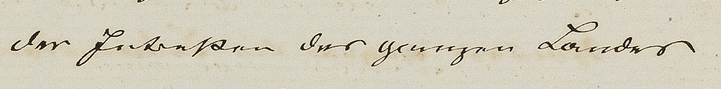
der Intreßen des ganzen Landes
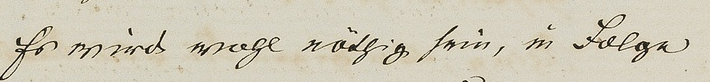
Es wird wohl nöthig sein, in Folge
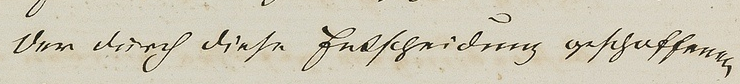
der durch diese Entscheidung geschaffenen
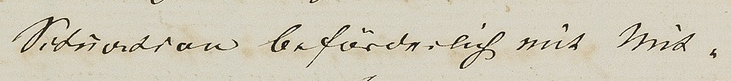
Situation beförderlich mit Mit-
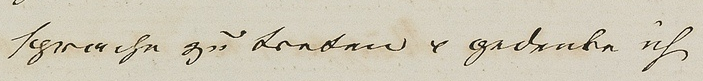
sprache zu treten & gedenke ich
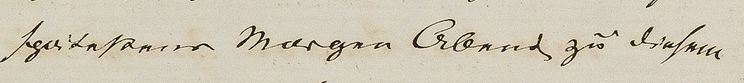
spätestens Morgen Abend zu diesem
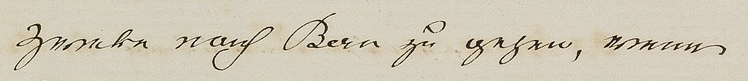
Zweke nach Bern zu gehen, wenn
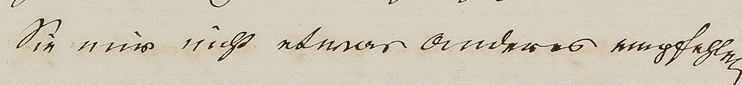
Sie mir nicht etwas anderes empfehlen.
